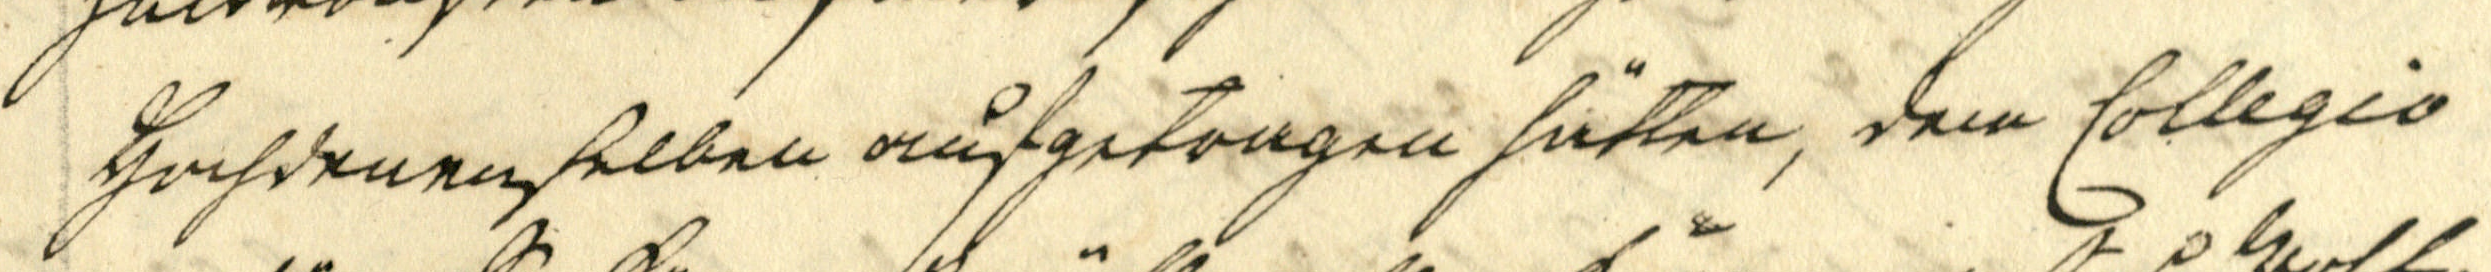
Hochdenenselben aufgetragen hätten, dem Collegio
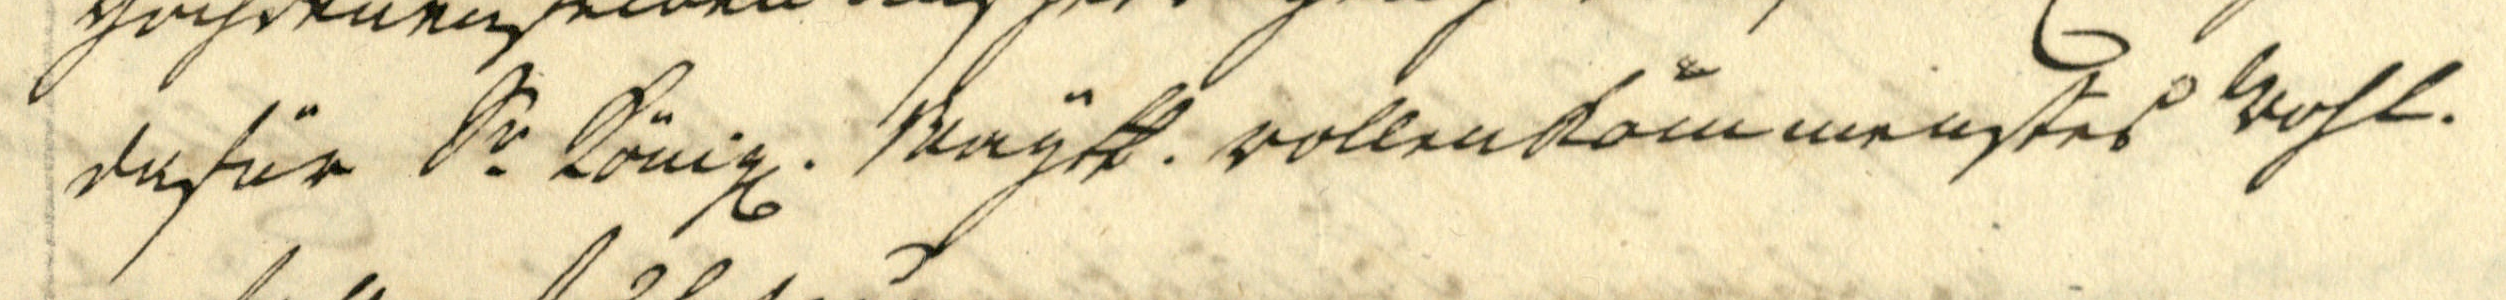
dafür Sr Königl. Maÿtt. vollenkommenstes Wohl¬
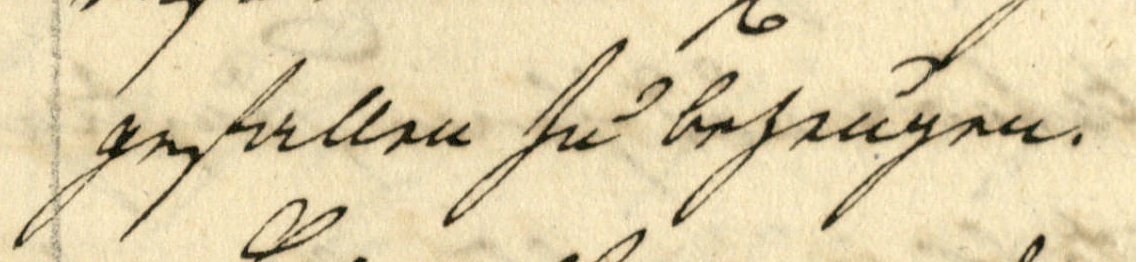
gefallen zu bezeugen.
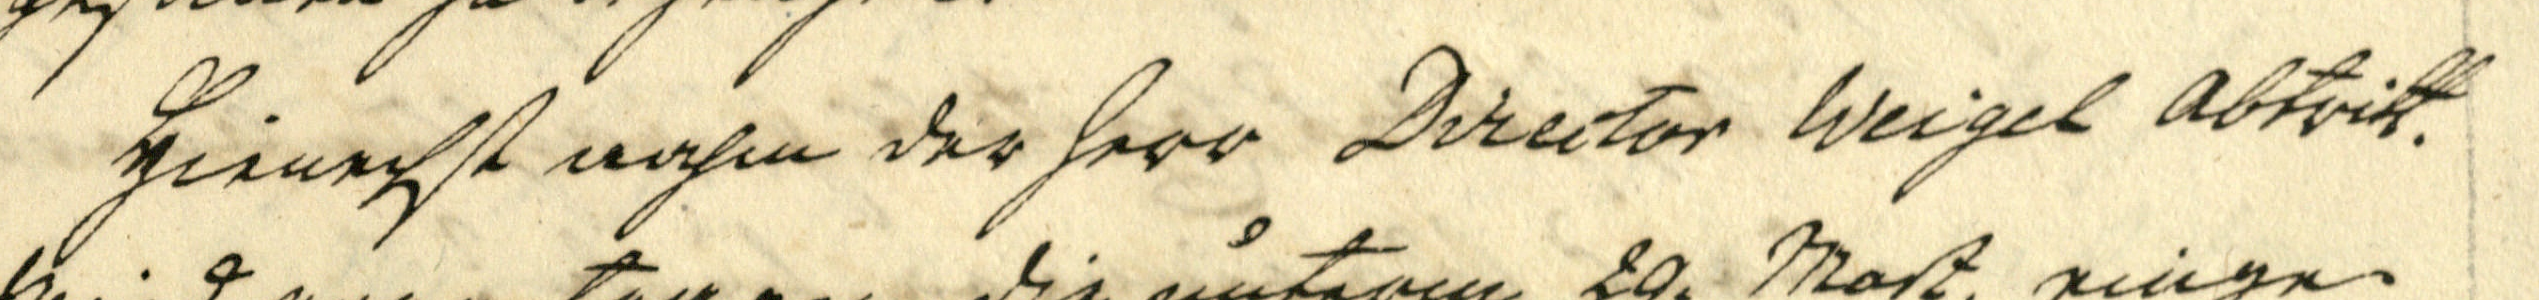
Hienechst nahm der Herr Director Weigel Abtritt.
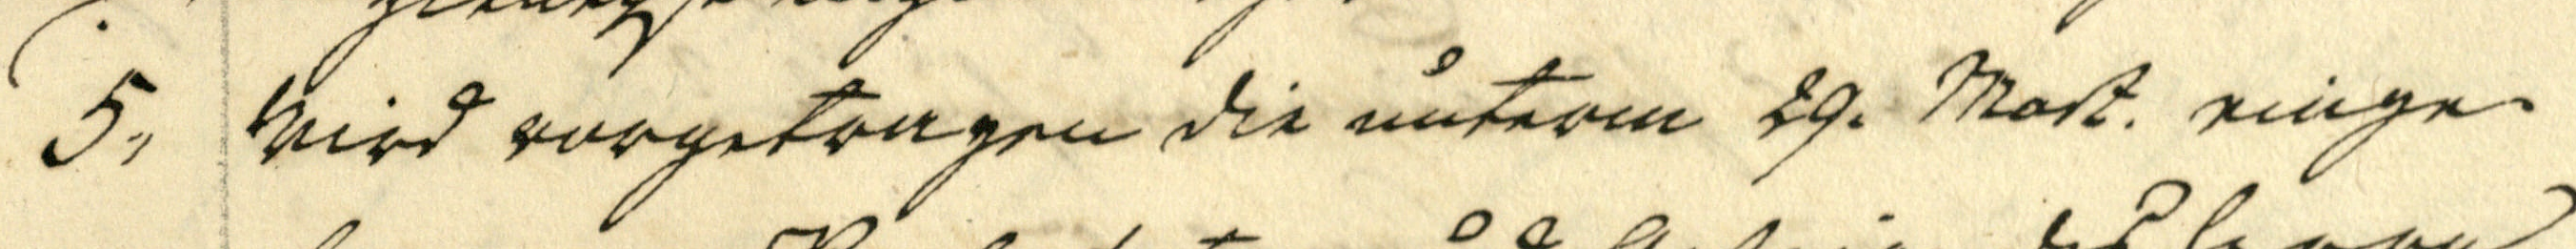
5., Wird vorgetragen die unterm 29. Mart. einge¬
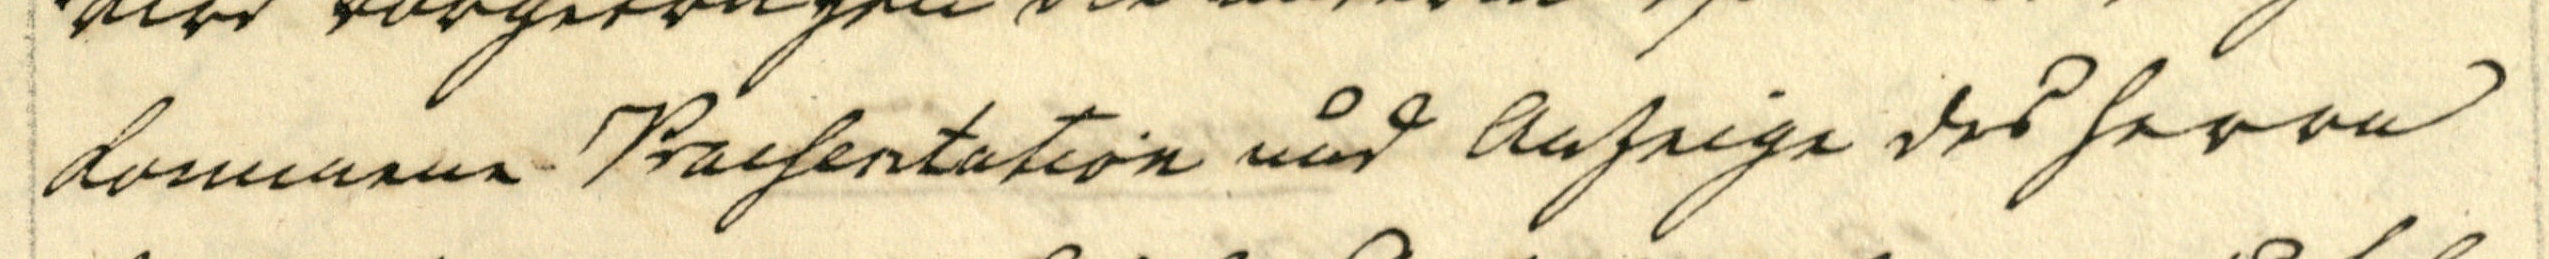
kommene Praesentation und Anzeige des Herrn
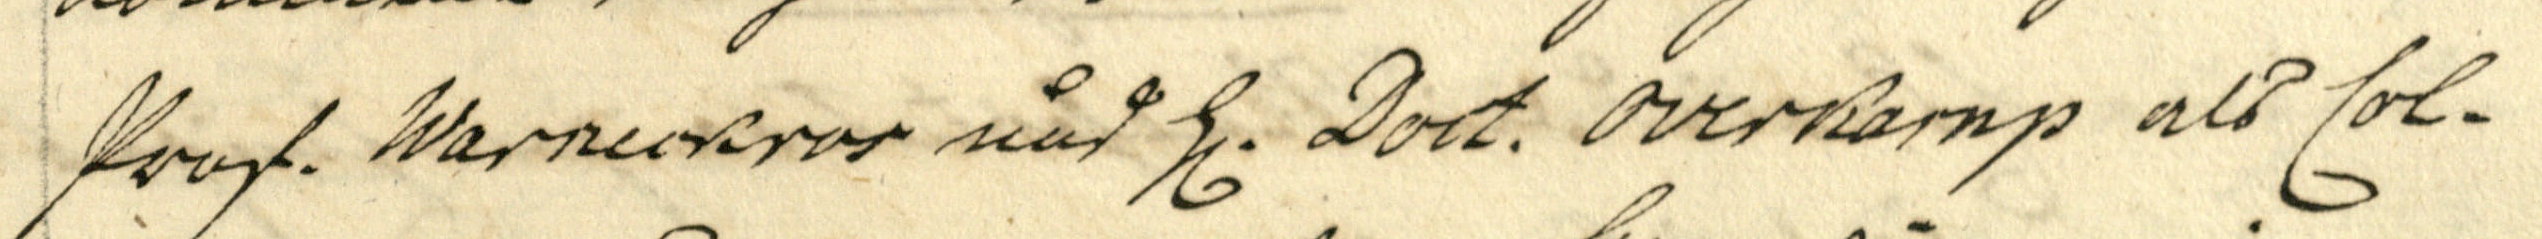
Prof. Warneckros und H. Doct. Overkamp als Col¬
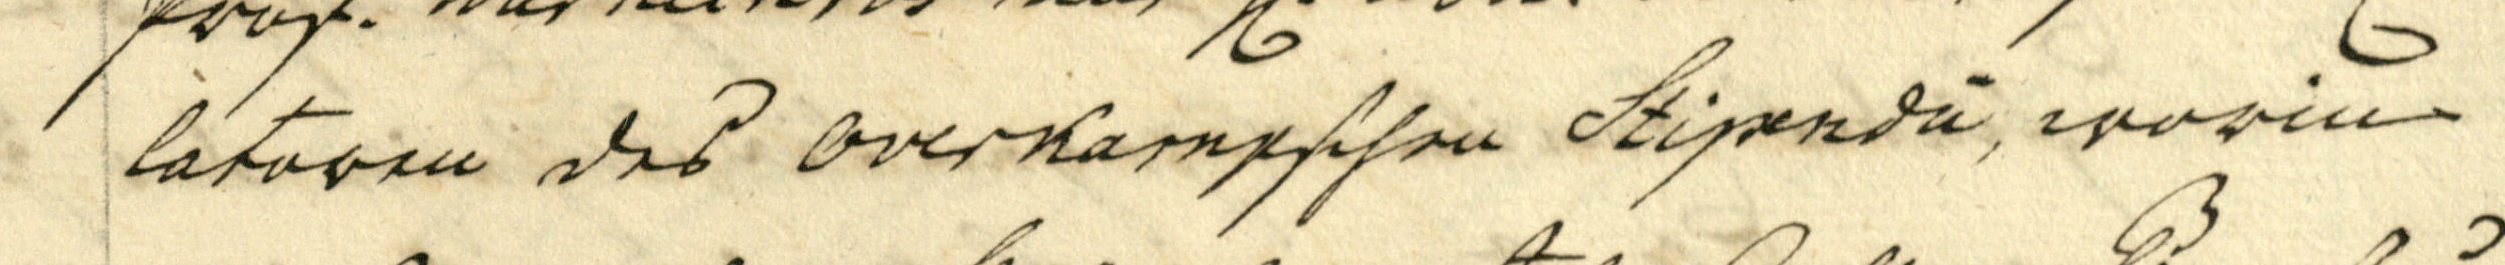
latoren des Overkampschen Stipendii, worin
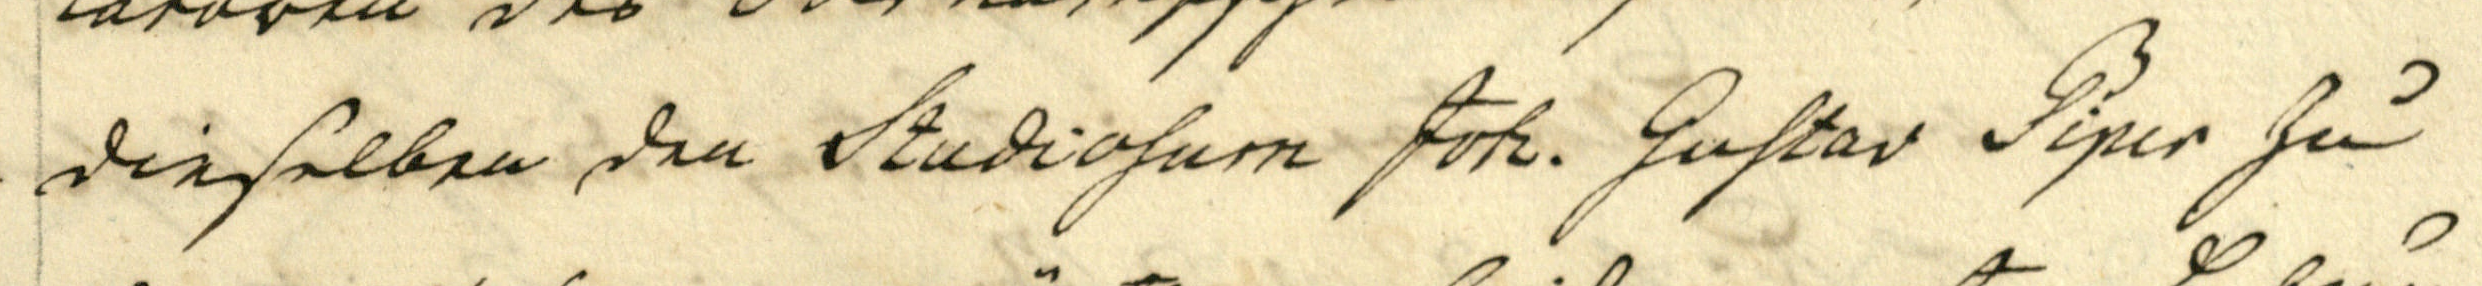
dieselben den Studiosum Joh. Gustav Piper zu
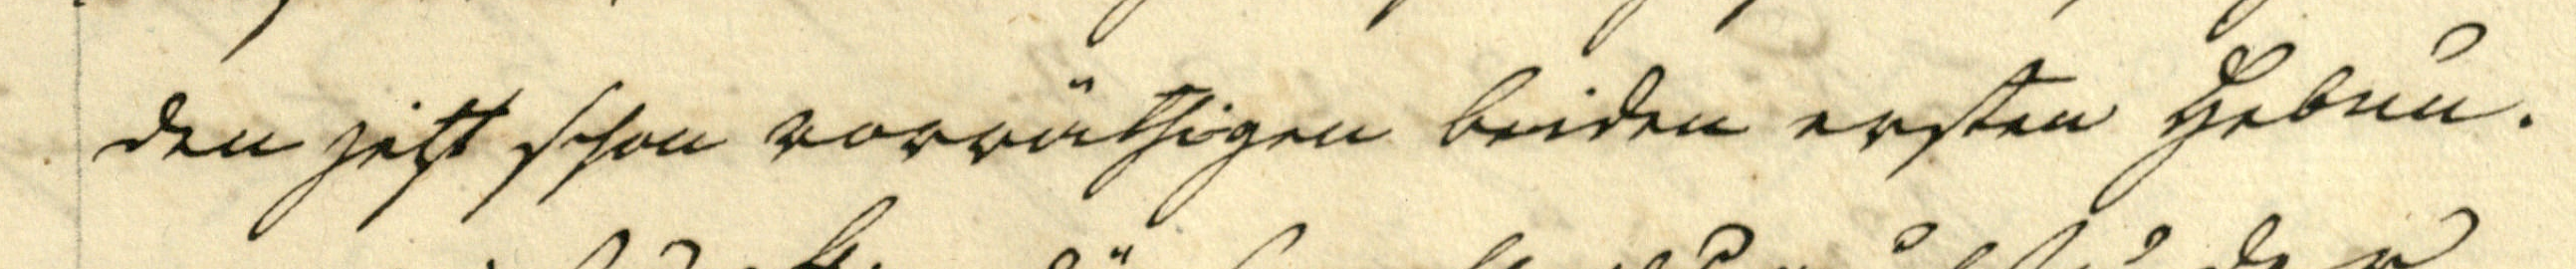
den jetzt schon vorräthigen beiden ersten Hebun¬
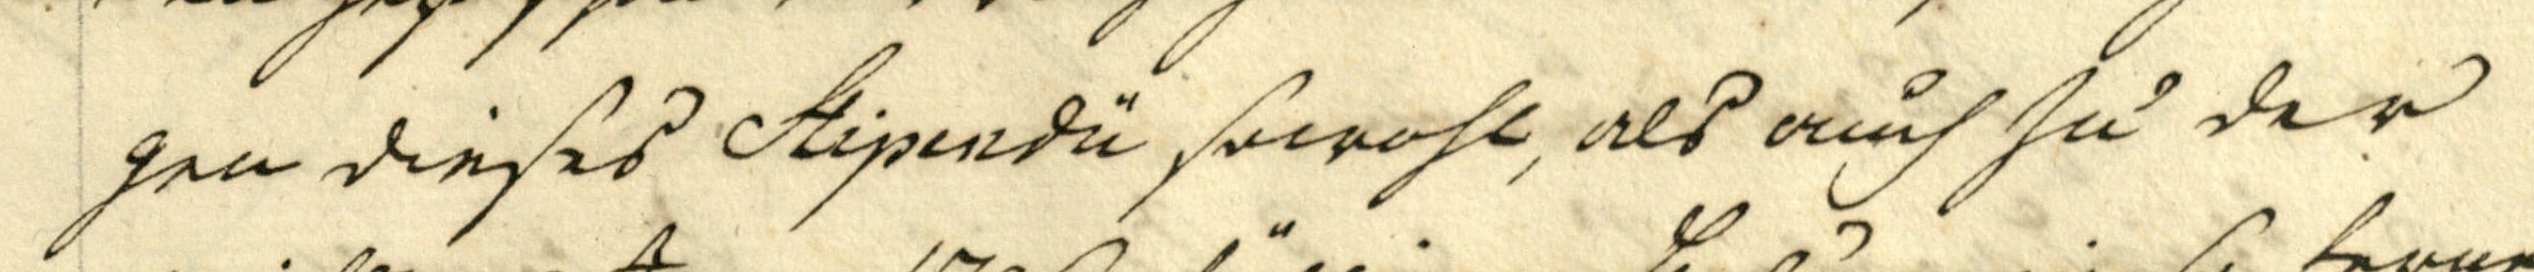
gen dieses Stipendii sowohl, als auch zu der
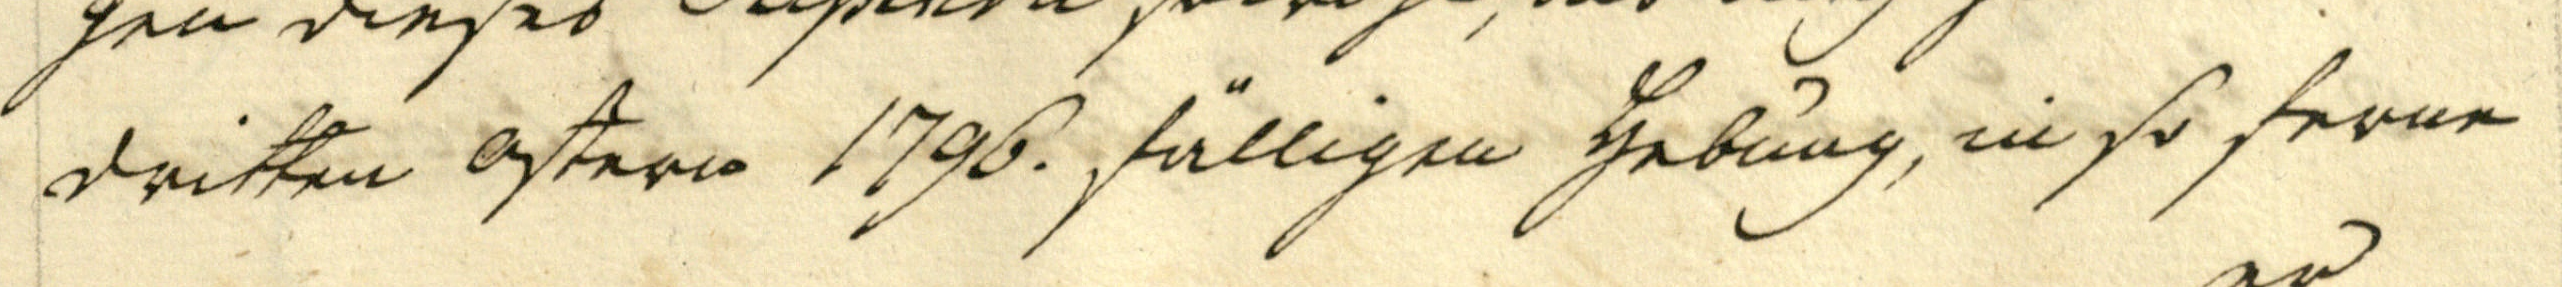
dritten Ostern 1796. fälligen Hebung, in so ferne
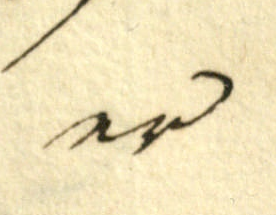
er
